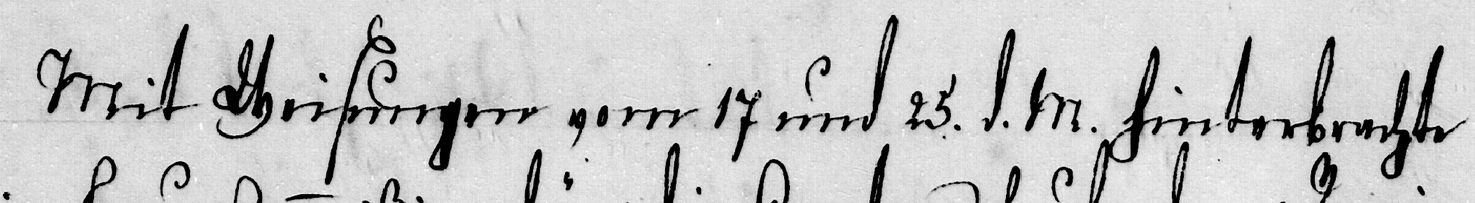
Mit Weisungen vom 17 und 25. d. M. hinterbrachte
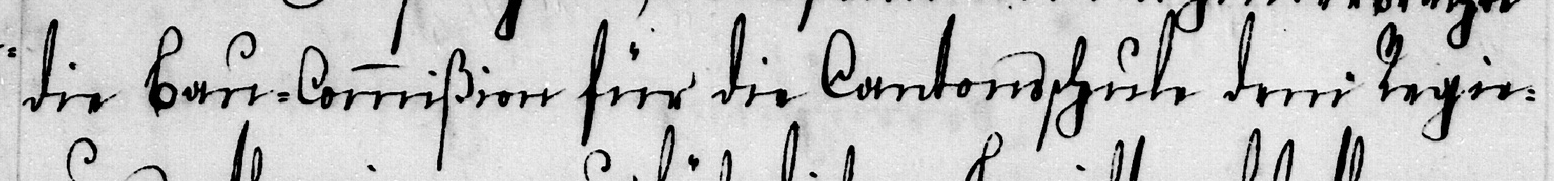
die Bau-Commißion für die Cantonsschule dem Regie¬
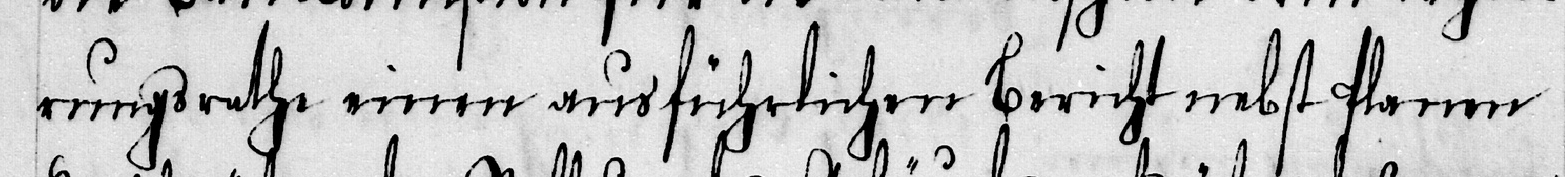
rungsrathe einen ausführlichen Bericht nebst Planen
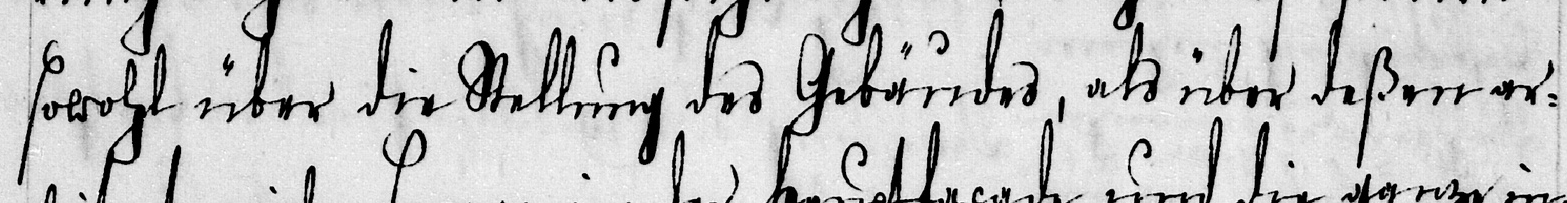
sowohl über die Stellung des Gebäudes, als über deßen ar¬
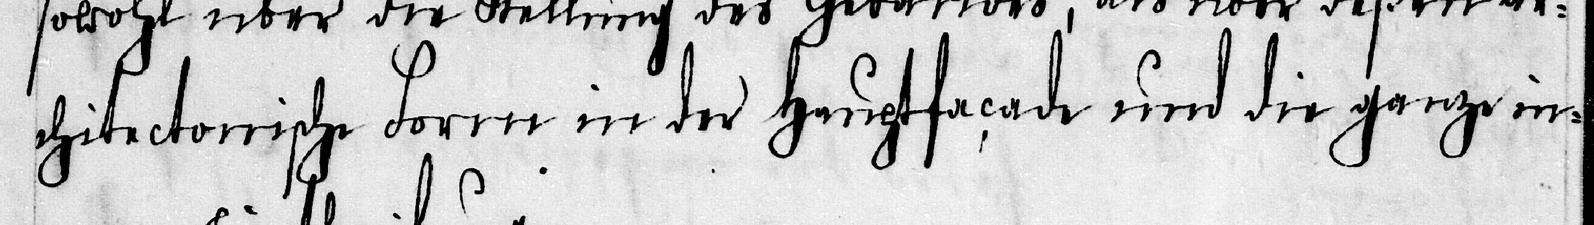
chitectonische Form in der Hauptfacade und die ganze in¬
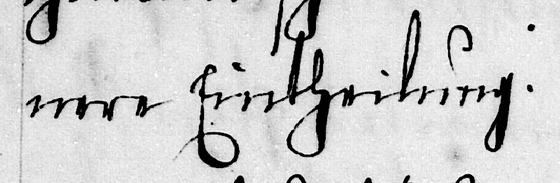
nere Eintheilung.
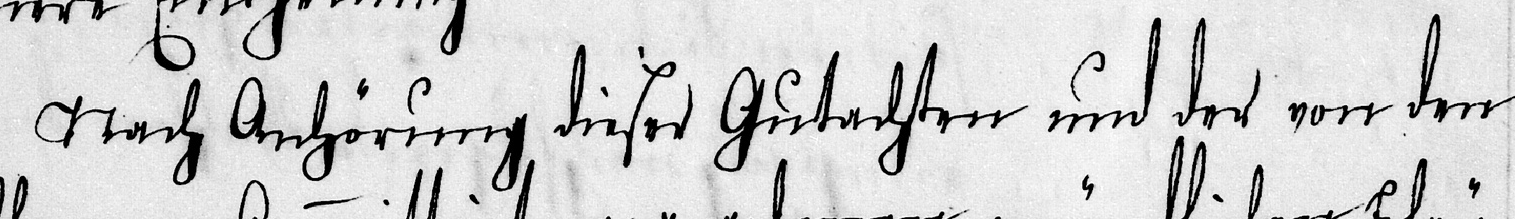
Nach Anhörung dieser Gutachten und der von den
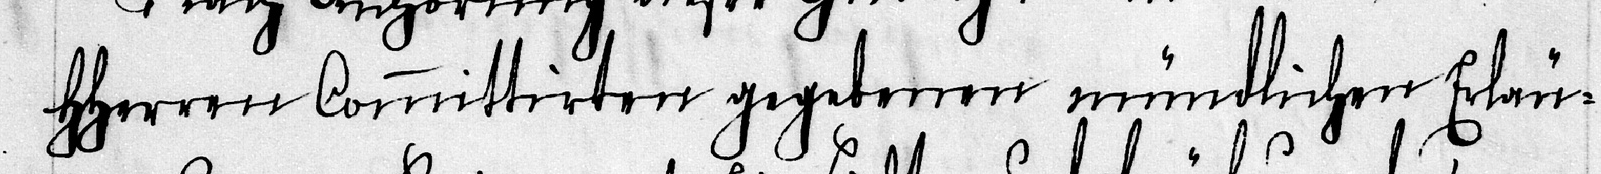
HHerren Committirten gegebenen mündlichen Erläu¬
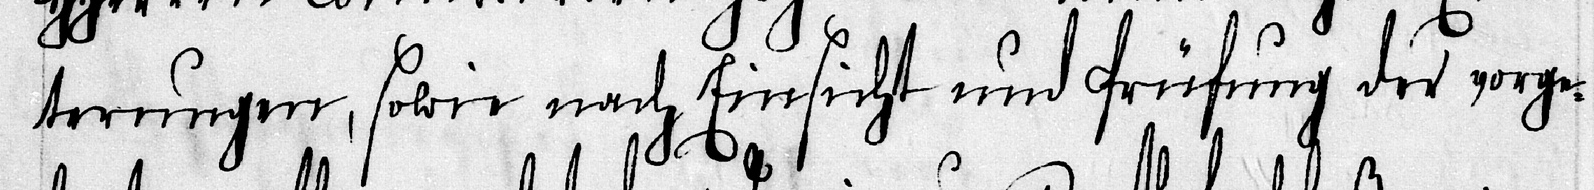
terungen, sowie nach Einsicht und Prüfung der vorge¬
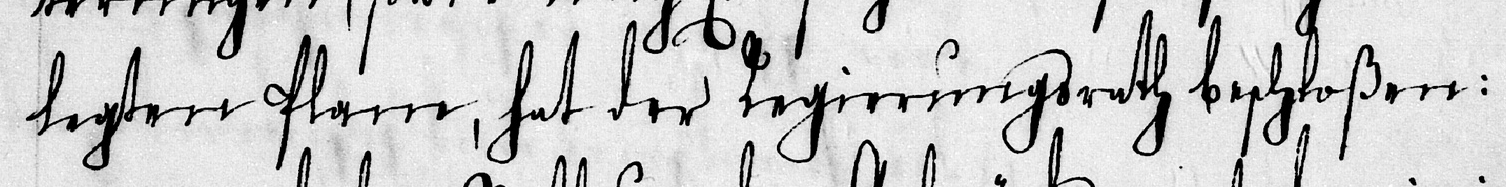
legten Plane, hat der Regierungsrath beschloßen:
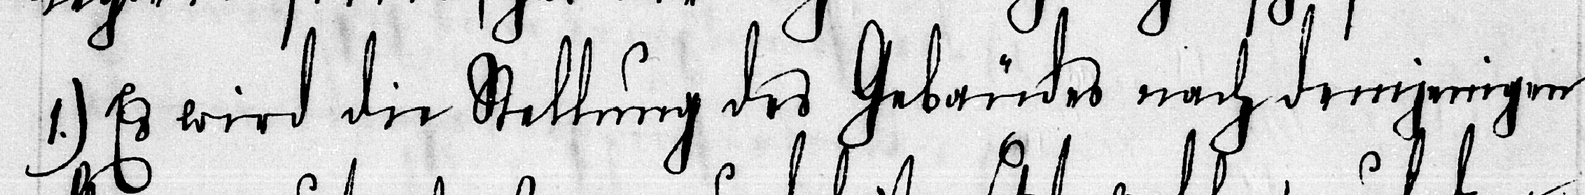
1.) Es wird die Stellung des Gebäudes nach demjenigen
